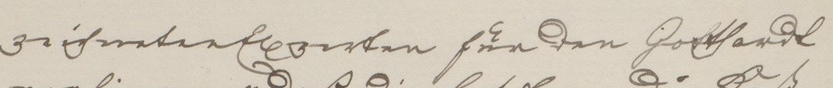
zeichneten Experten für den Gotthardt
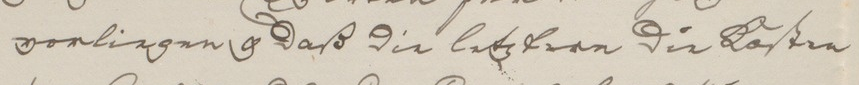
vorliegen & daß die letztern die Kosten
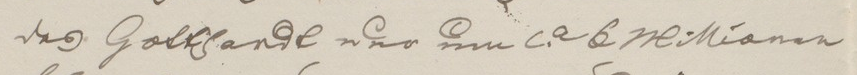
des Gotthardt nur um ca 6 Millionen
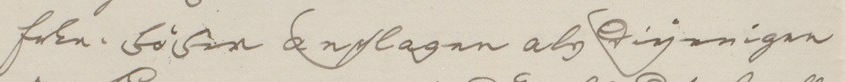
Frkn. höher anschlagen als diejenigen
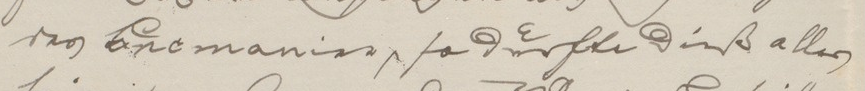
des Lucmanier, so dürfte dieß alles
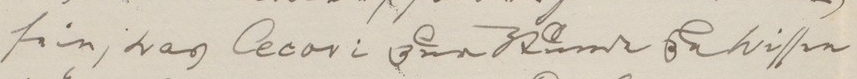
sein, was Cecovi zur Stunde zu wissen
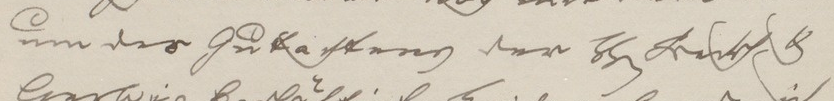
um des Gutachtens der HH Beckh &
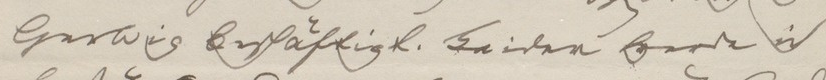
Gerwig beschäftigt. Leider werde ich
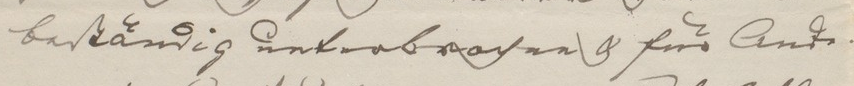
beständig unterbrochen & für Ande-
